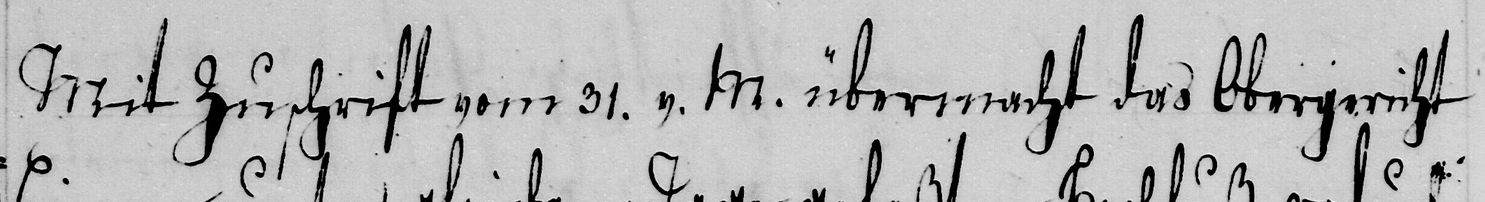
Mit Zuschrift vom 31. v. M. übermacht das Obergericht
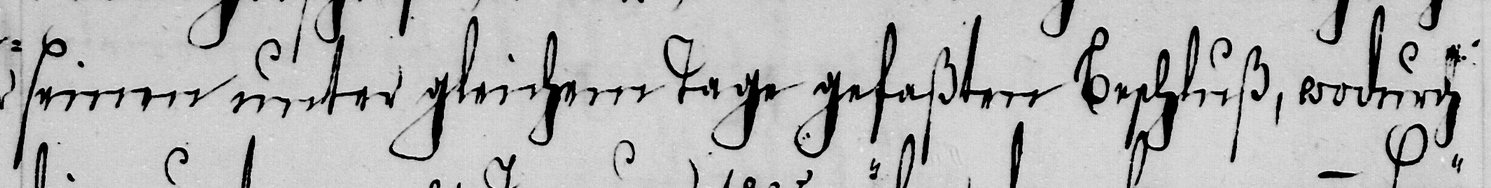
seinen unter gleichem Tage gefaßten Beschluß, wodurch
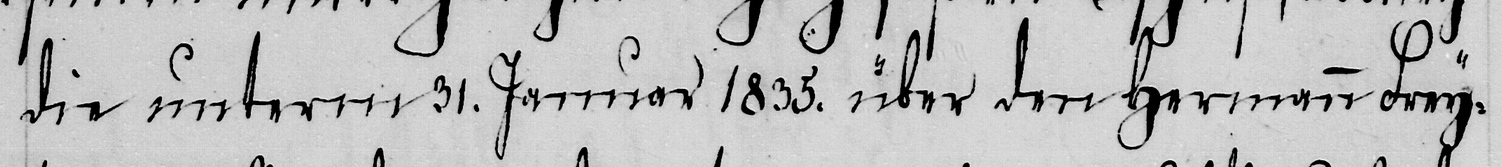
die unterm 31. Januar 1835. über den Hermann Frey¬
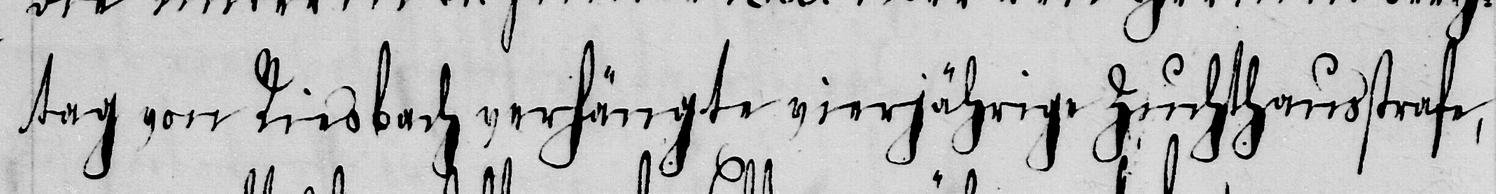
tag von Riesbach verhängte vierjährige Zuchthausstrafe,
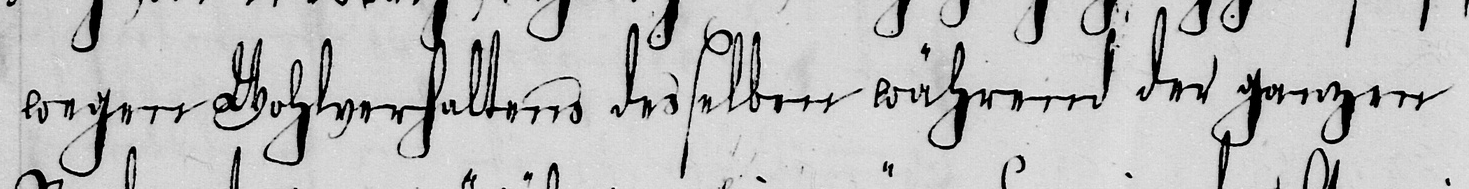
wegen Wohlverhaltens desselben während der ganzen
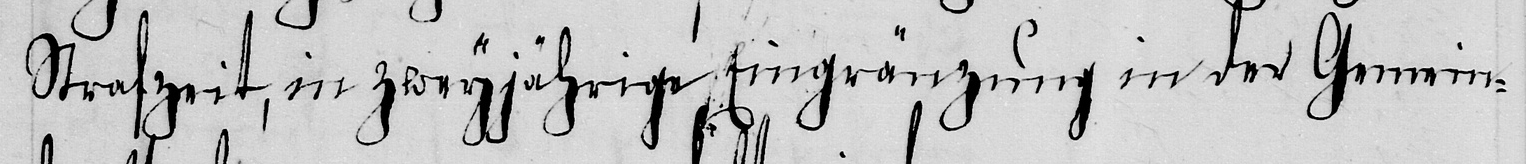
Strafzeit, in zweyjährige Eingränzung in der Gemein¬
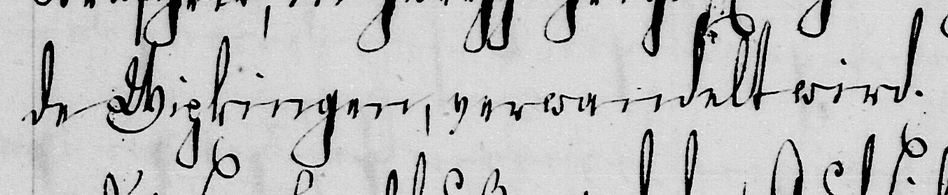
de Wipkingen, verwandelt wird.
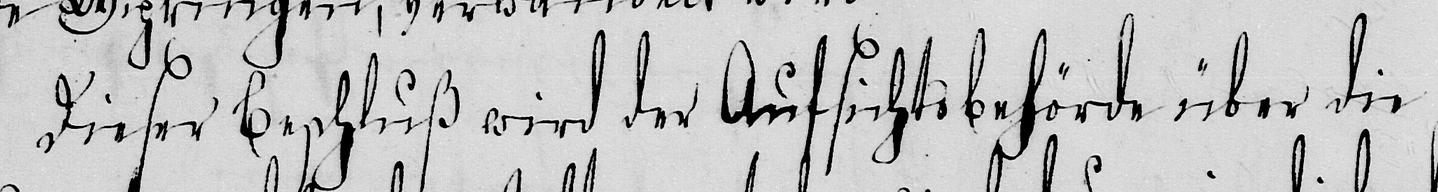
Dieser Beschluß wird der Aufsichtsbehörde über die
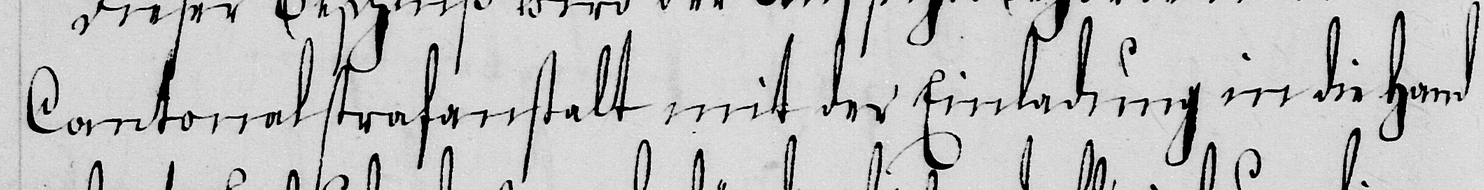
Cantonalstrafanstalt mit der Einladung in die
